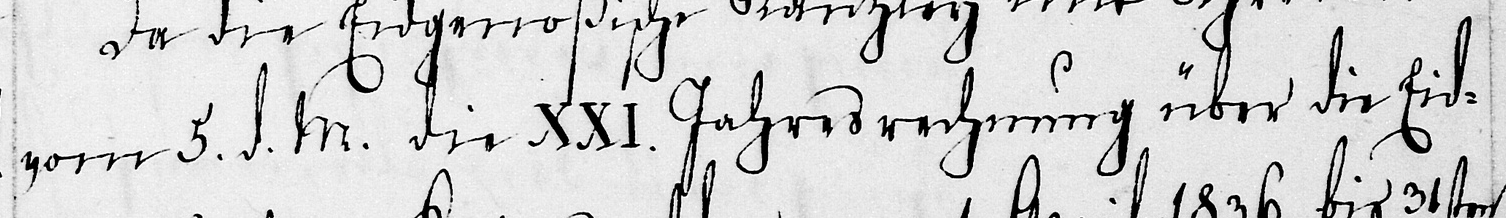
vom 5. d. M. die XXI. Jahresrechnung über die Eid¬
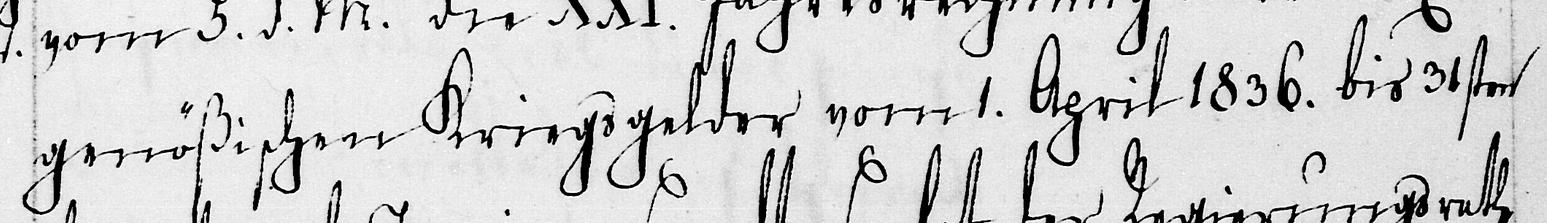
genößischen Kriegsgelder vom 1. April 1836. bis 31sten
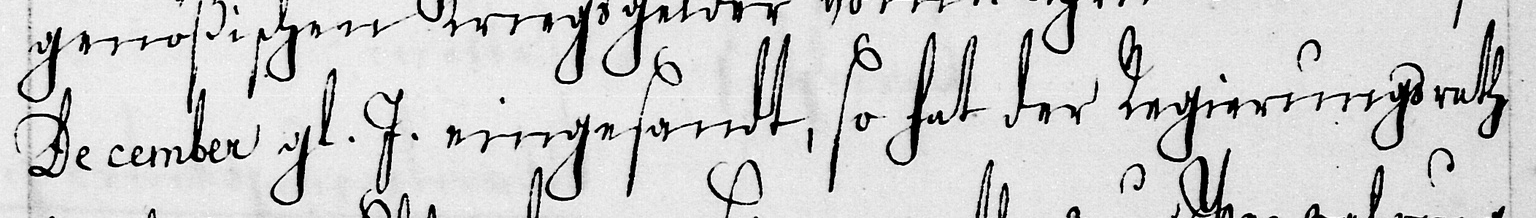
December gl. J. eingesandt, so hat der Regierungsrath
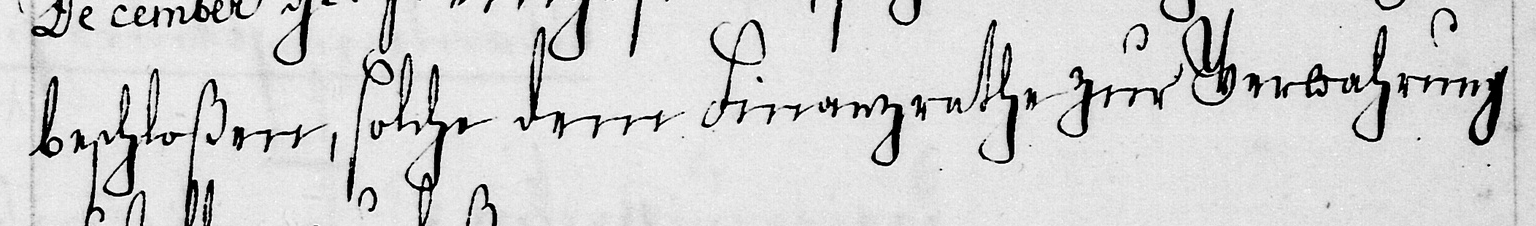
beschloßen, solche dem Finanzrathe zur Verwahrung
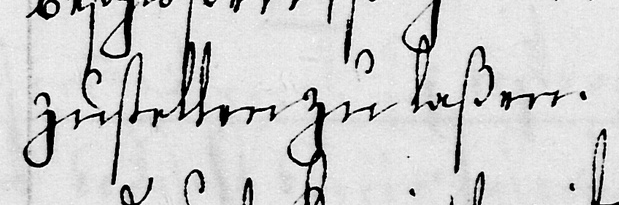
zustellen zu laßen.
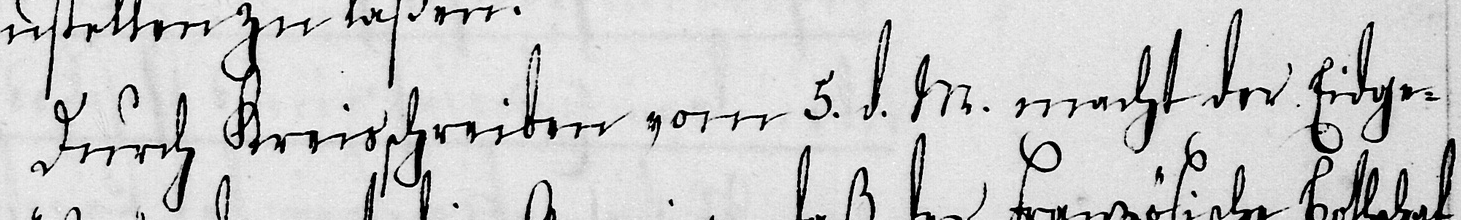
Durch Kreisschreiben vom 5. d. M. macht der Eidge¬
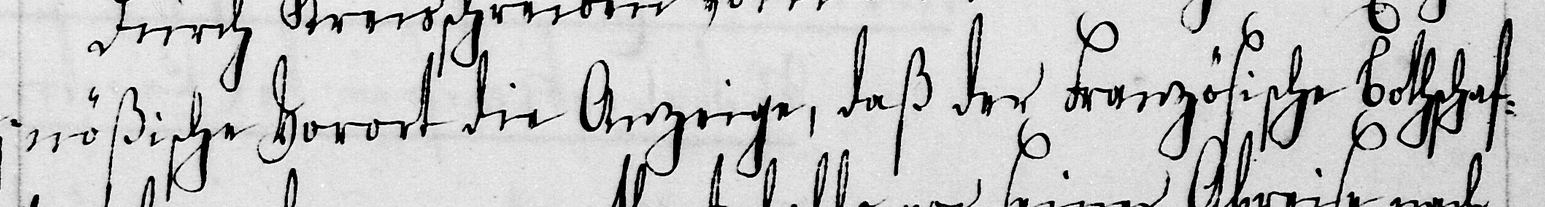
nößische Vorort die Anzeige, daß der Französische Bothschaf¬
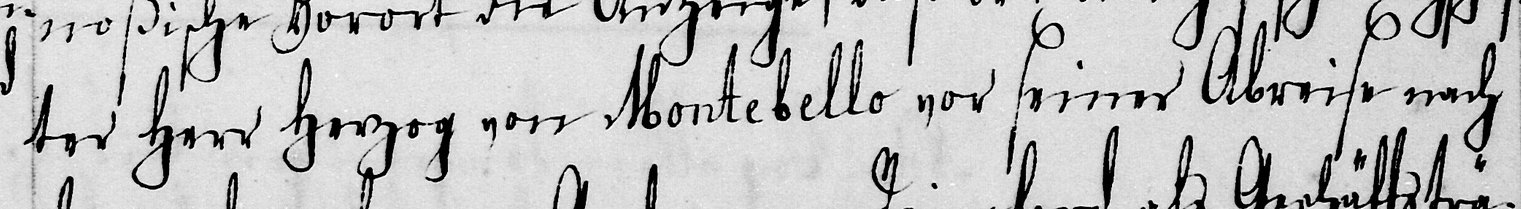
ter Herr Herzog von Montebello vor seiner Abreise nach
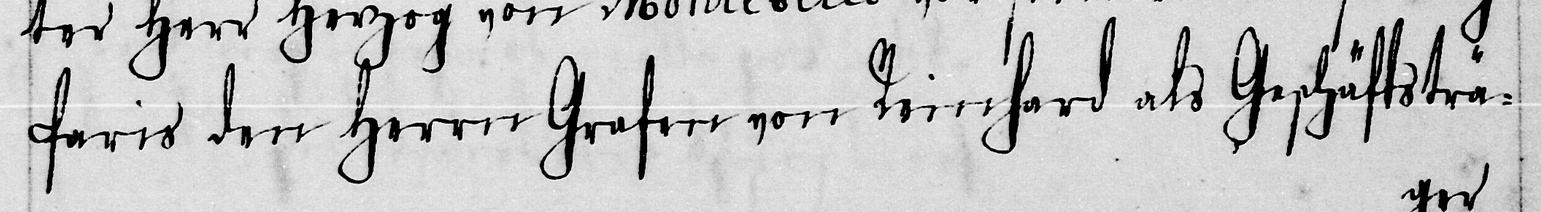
Paris den Herrn Grafen von Reinhard als Geschäftsträ-
